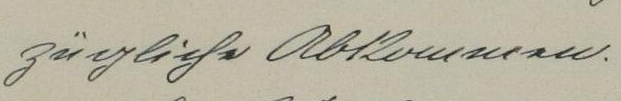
zügliche Abkommen.
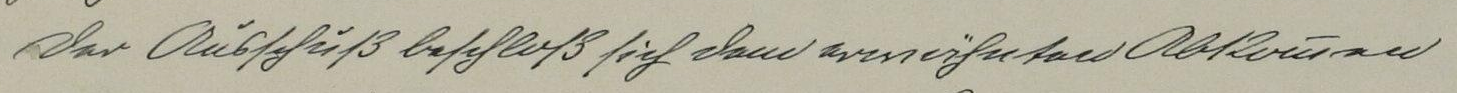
Der Ausschuß beschloß sich dem erwähnten Abkommen
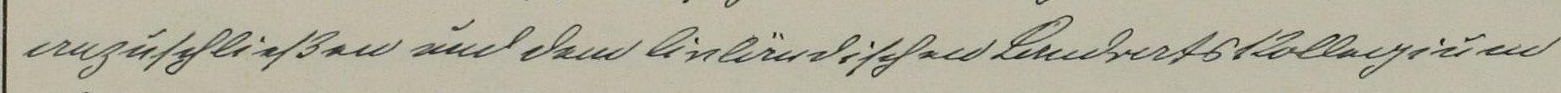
anzuschließen und dem livländischen Landratskollegium
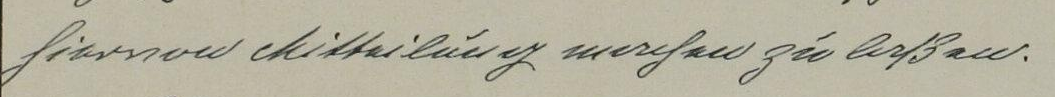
hiervon Mitteilung machen zu laßen.
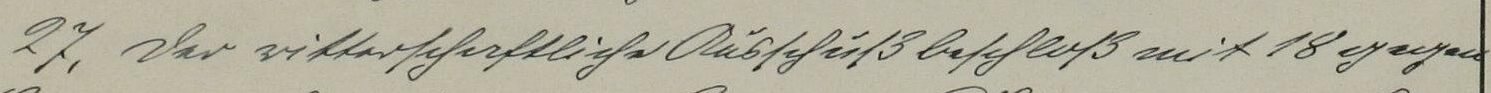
27. Der ritterschaftliche Ausschuß beschloß mit 18 gegen
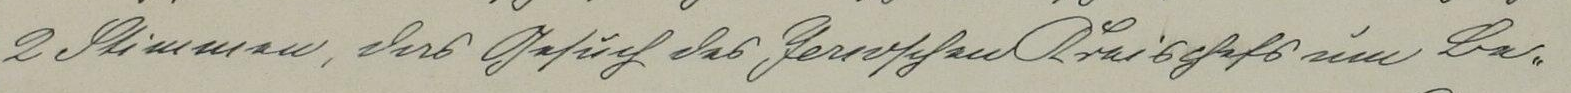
2 Stimmen, das Gesuch des Jerwschen Kreischefs um Be-
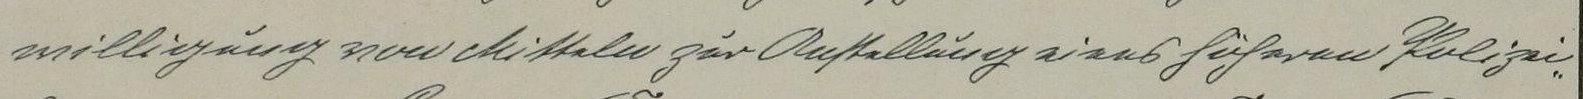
willigung von Mitteln zur Anstellung eines höheren Polizei-
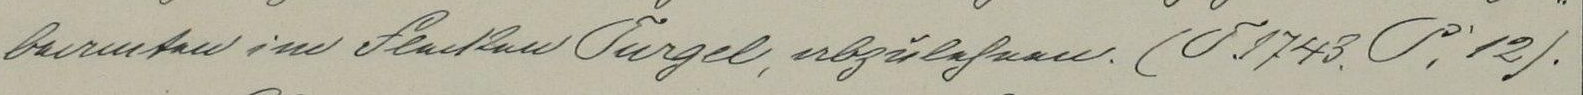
beamten im Flecken Turgel, abzulehnen. (T.1743; P.12).
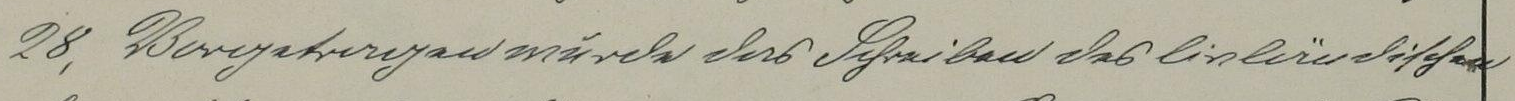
28. Vorgetragen wurde das Schreiben des livländischen
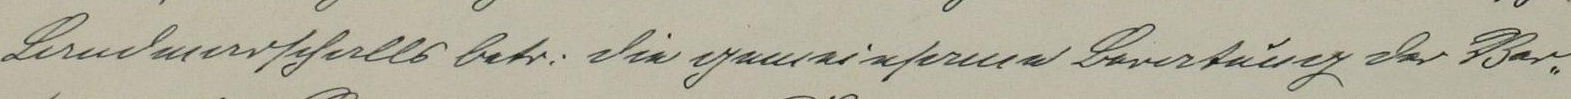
Landmarschalls betr. die gemeinsame Beratung der Ver-
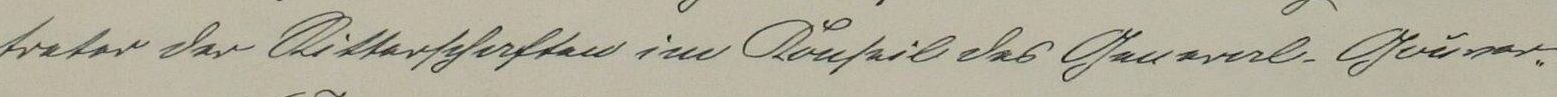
treter der Ritterschaften im Konseil des General-Gouver-
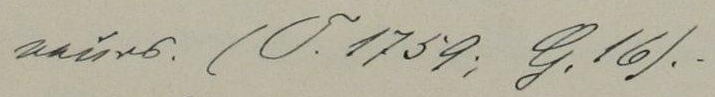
neurs. (T.1759; G.16).
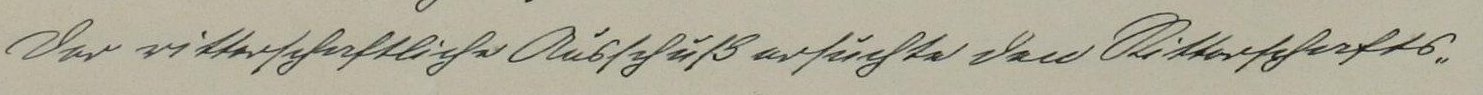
Der ritterschaftliche Ausschuß ersuchte den Ritterschafts-
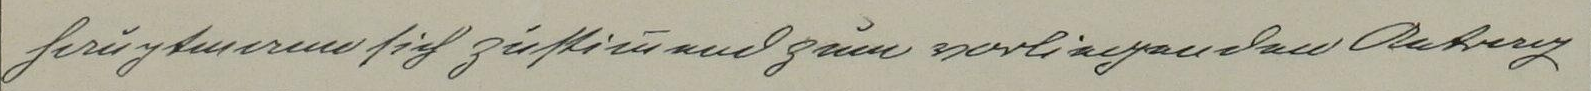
hauptmann sich zustimmend zum vorliegenden Antrag
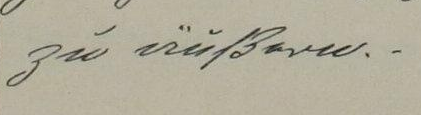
zu äußern.
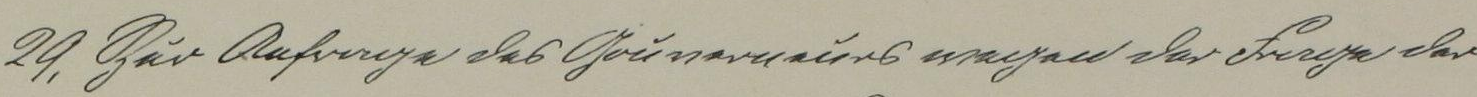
29. Zur Anfrage des Gouverneurs wegen der Frage der
